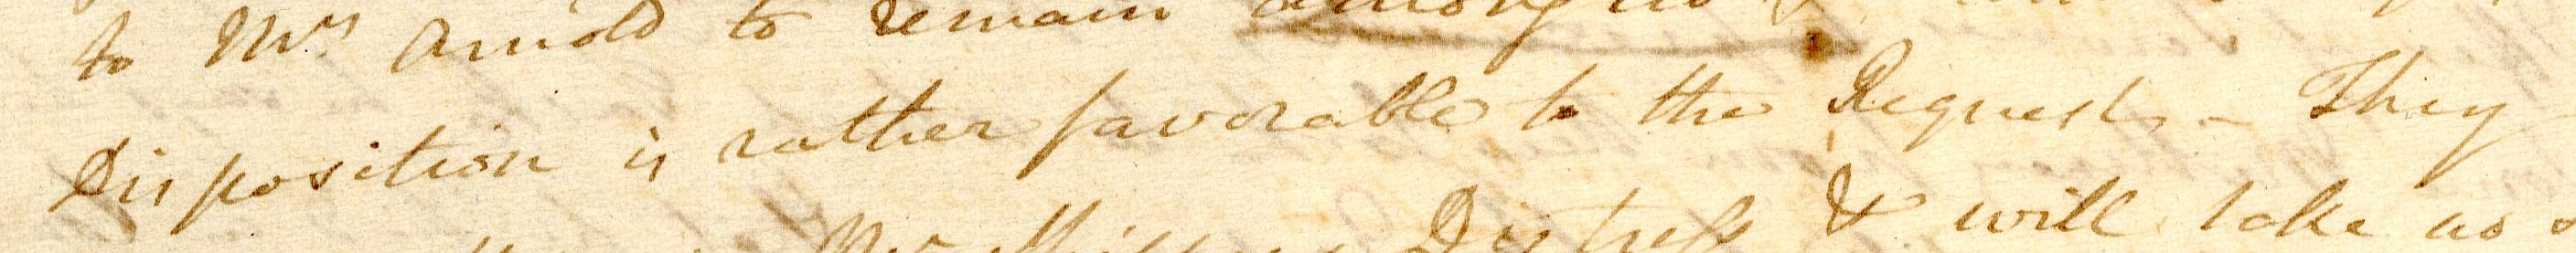Disposition is rather favorable to the Request. They
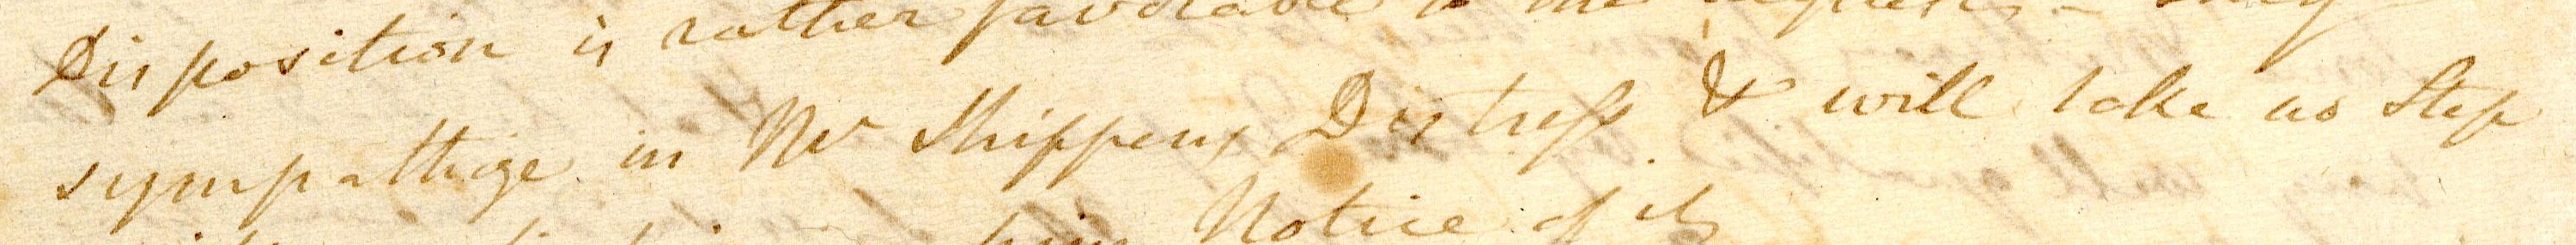sympathize in M^r Shippen's Distress & will take no Step
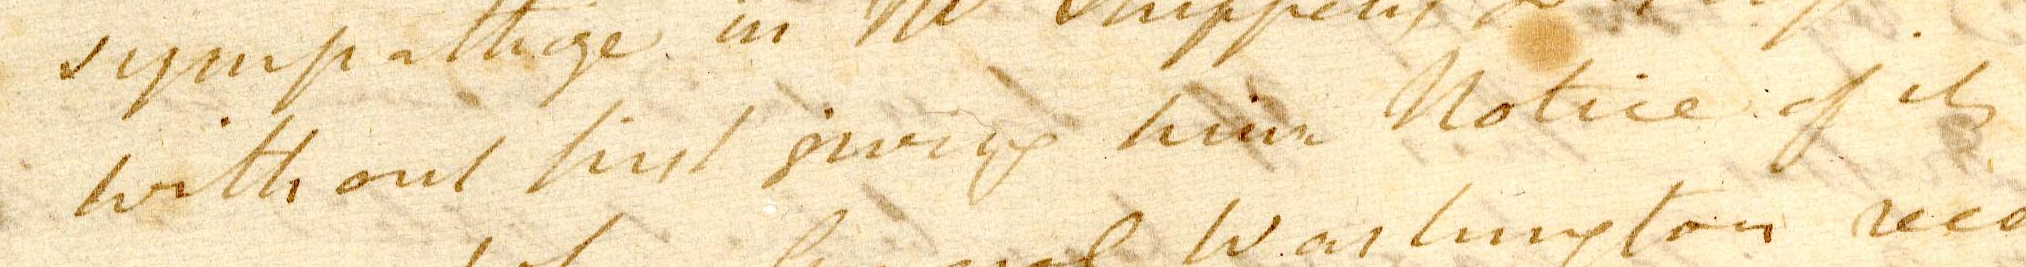without first giving him Notice of it
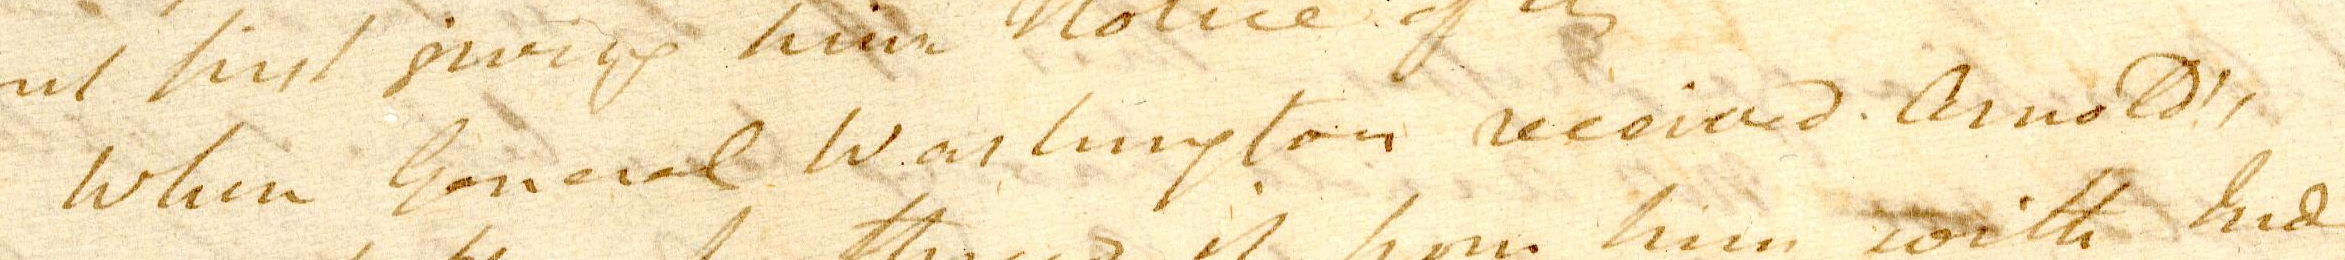When General Washington received Arnold's
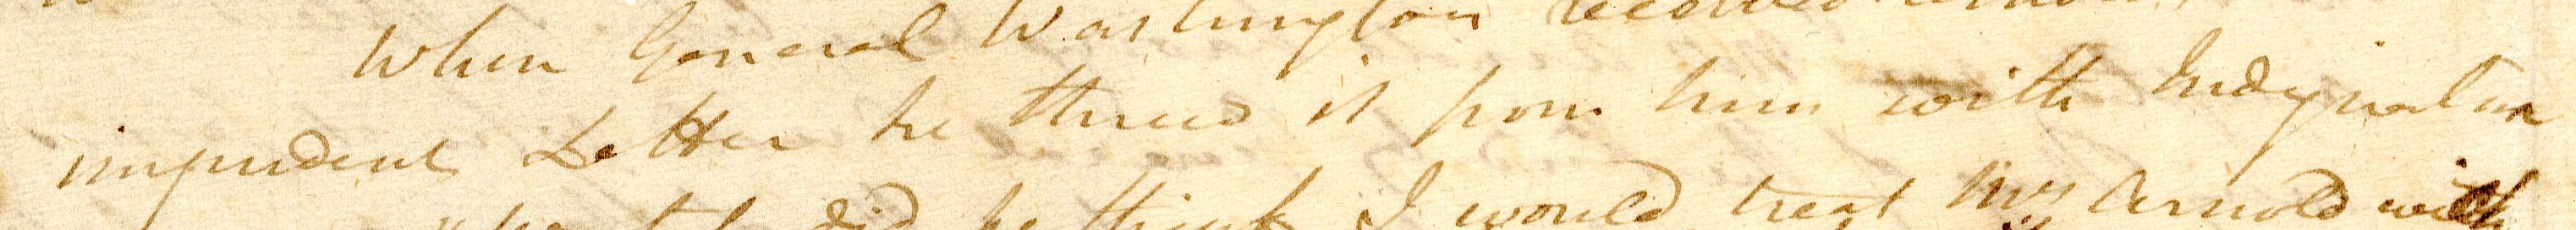impudent Letter he threw it from him with Indignation
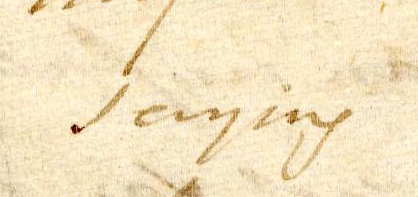saying
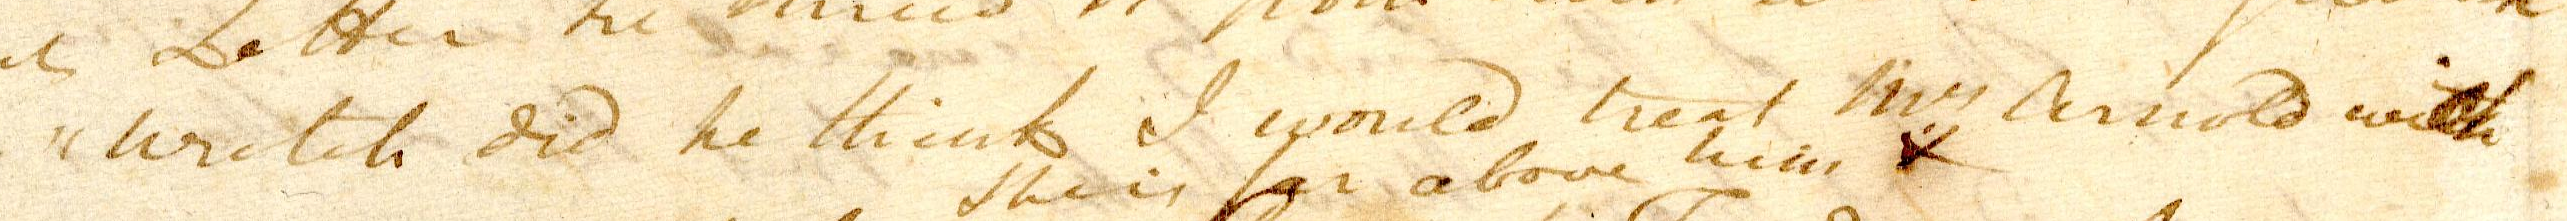"wretch did he think I would treat M^r. Arnold with
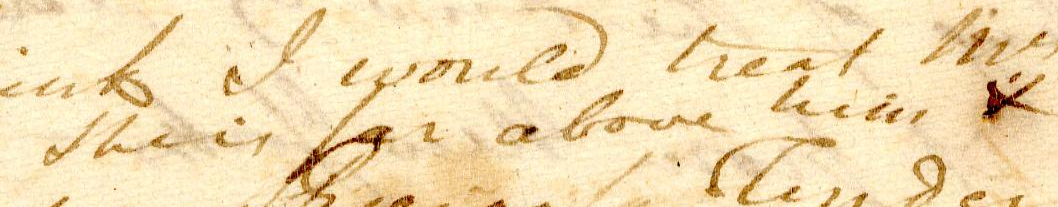she is far above him &
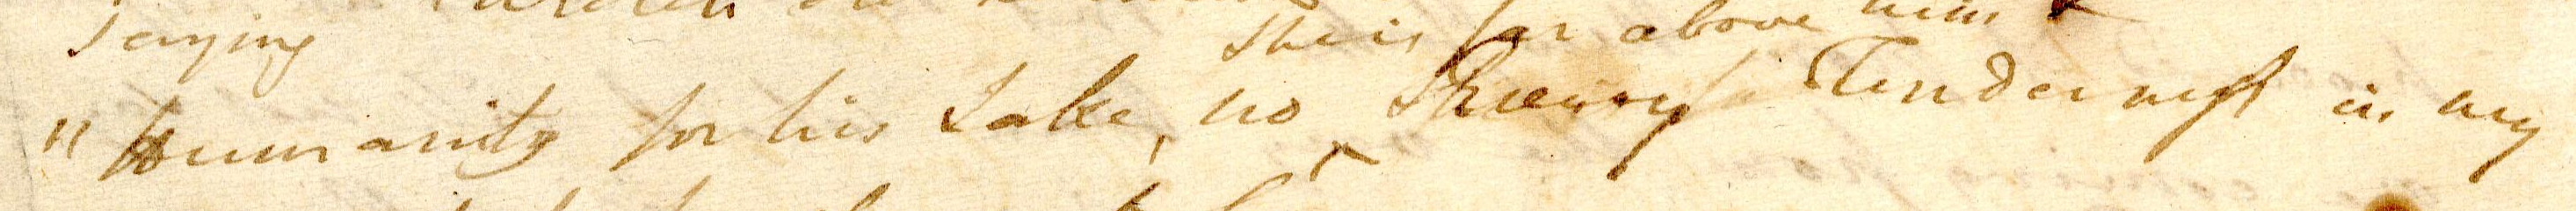"Humanity for his Sake, no ^ Every Tenderness is my
